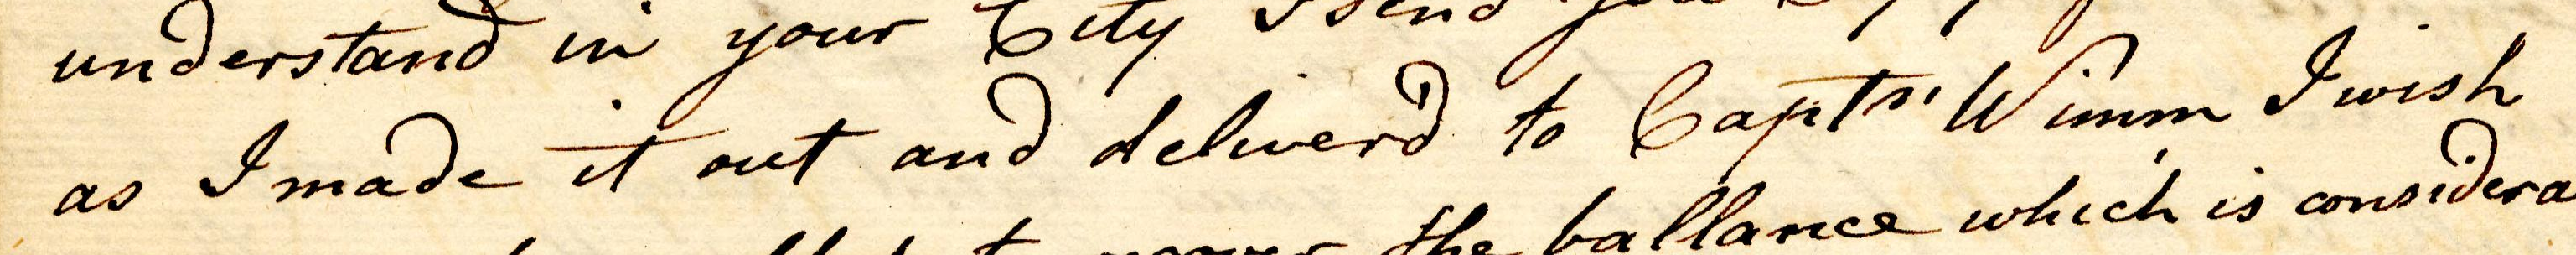as I made it out and deliver'd to Capt^n. Wimm I wish
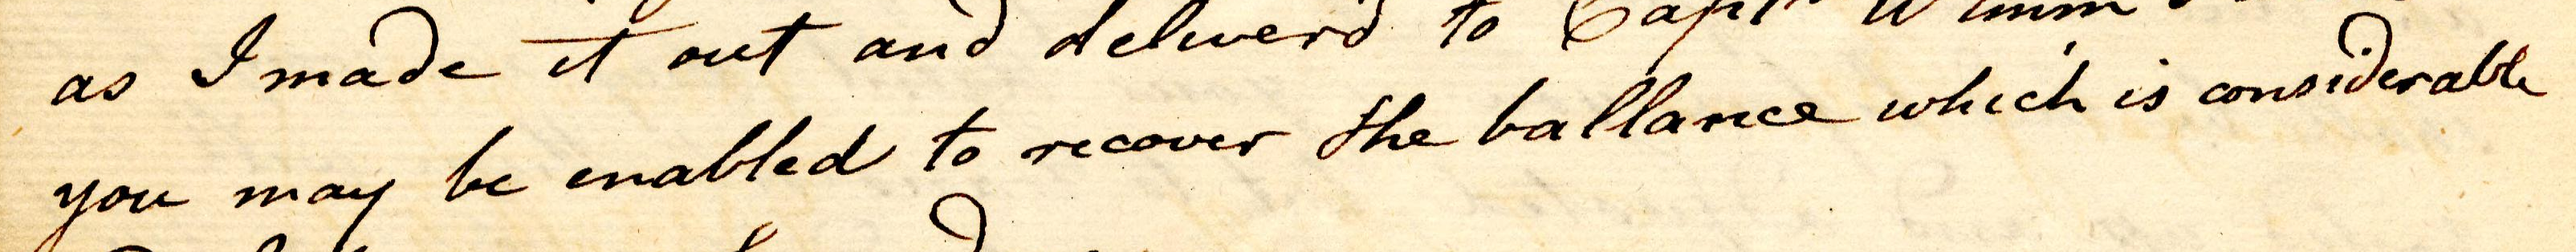you may be enabled to recover the ballance which is considerable
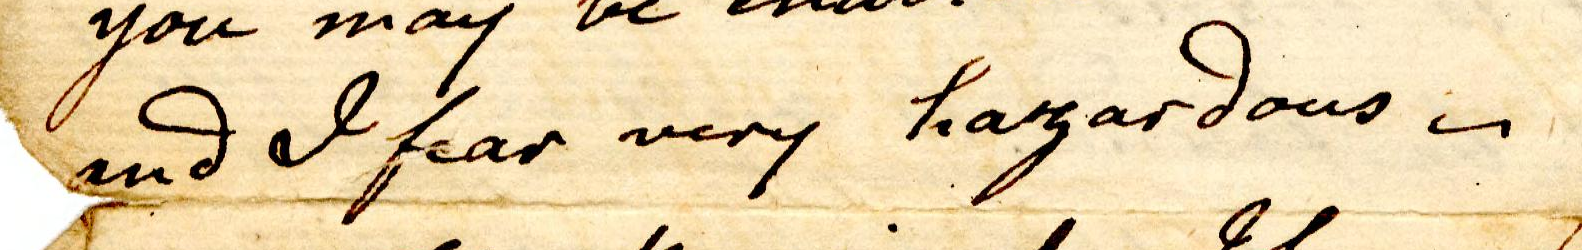and I fear very hazardous.
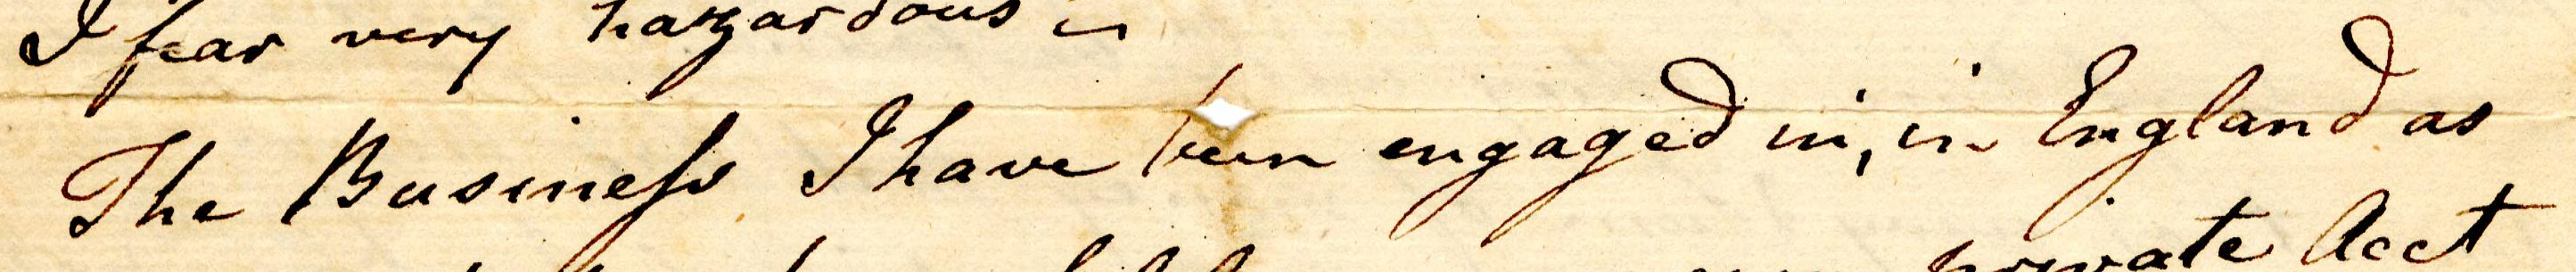The Business I have been engaged in, in England as
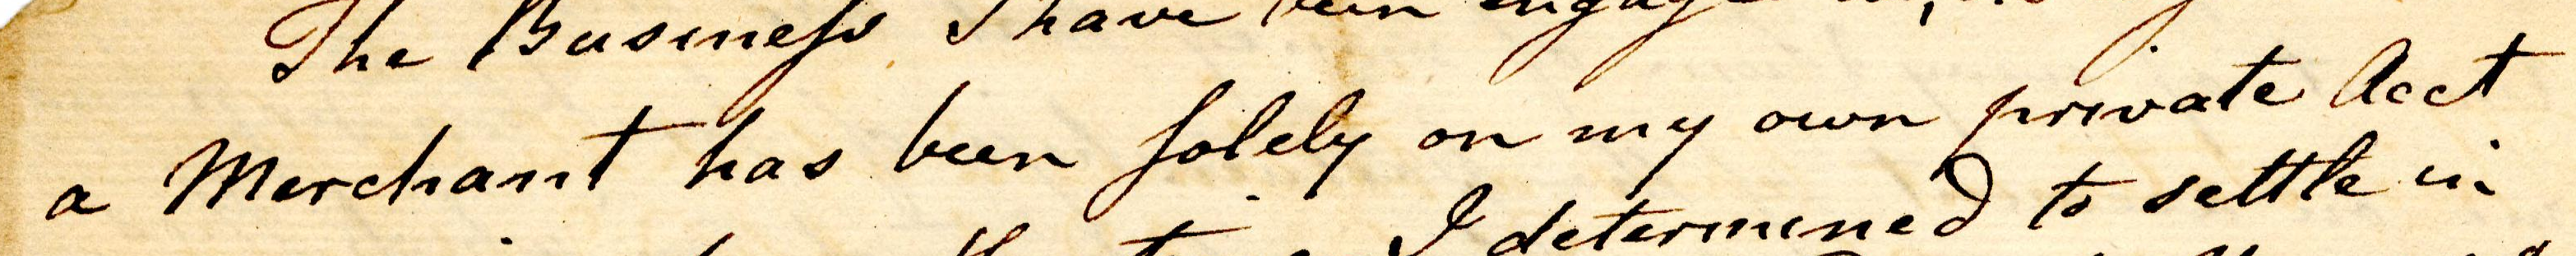a Merchant has been Solely on my own private Acct
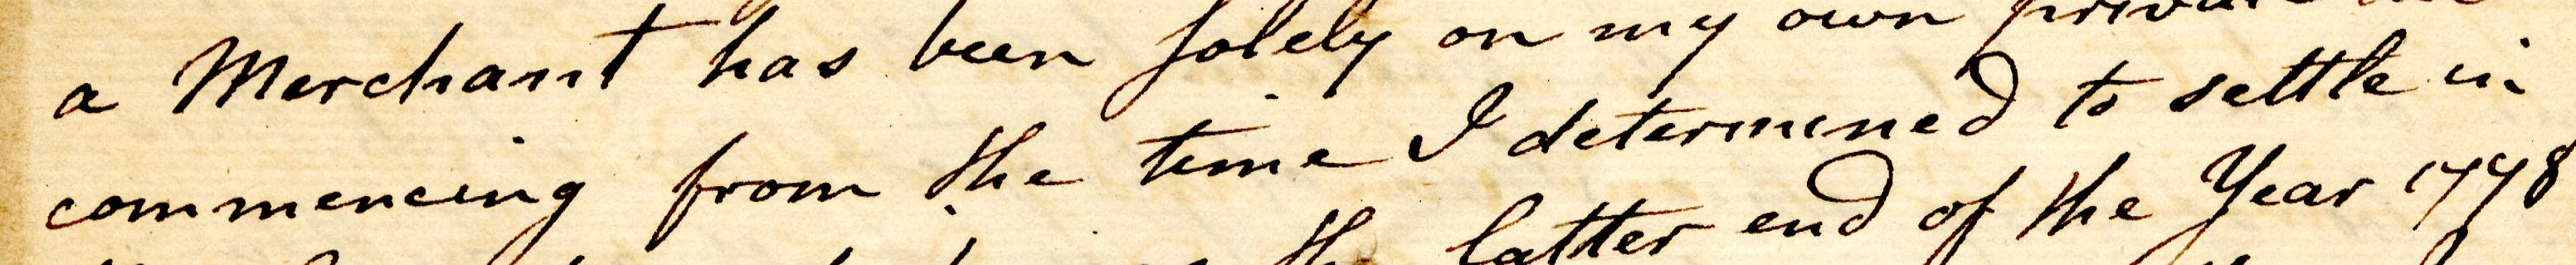commencing from the time I determined to settle in
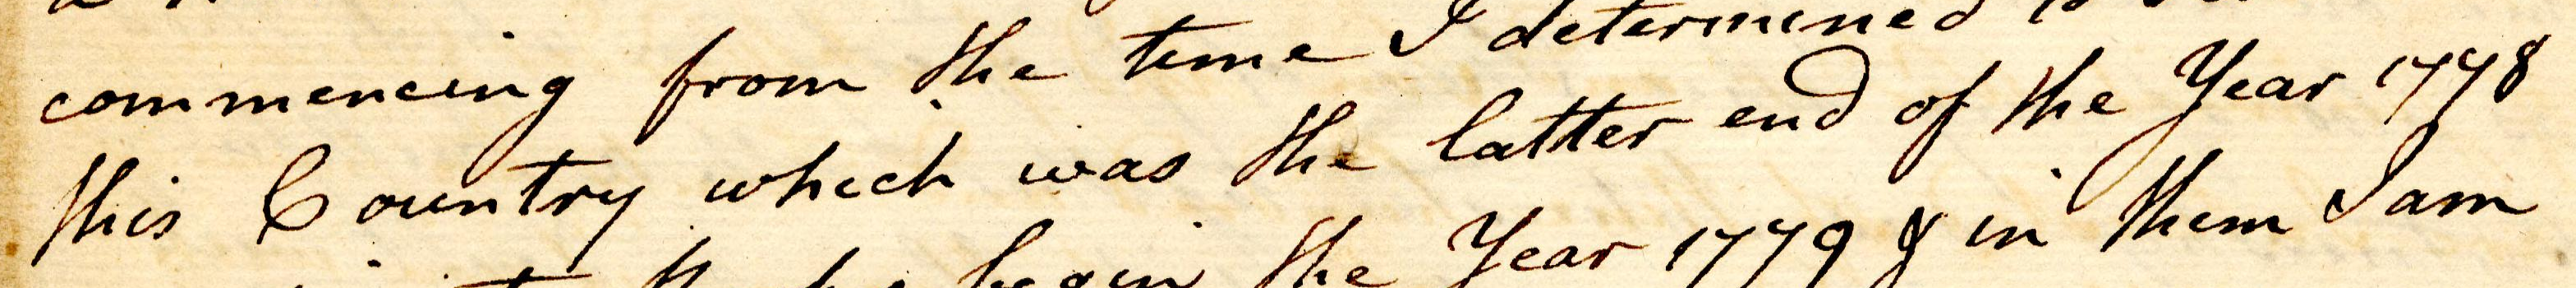this Country which was the latter end of the Year 1778
